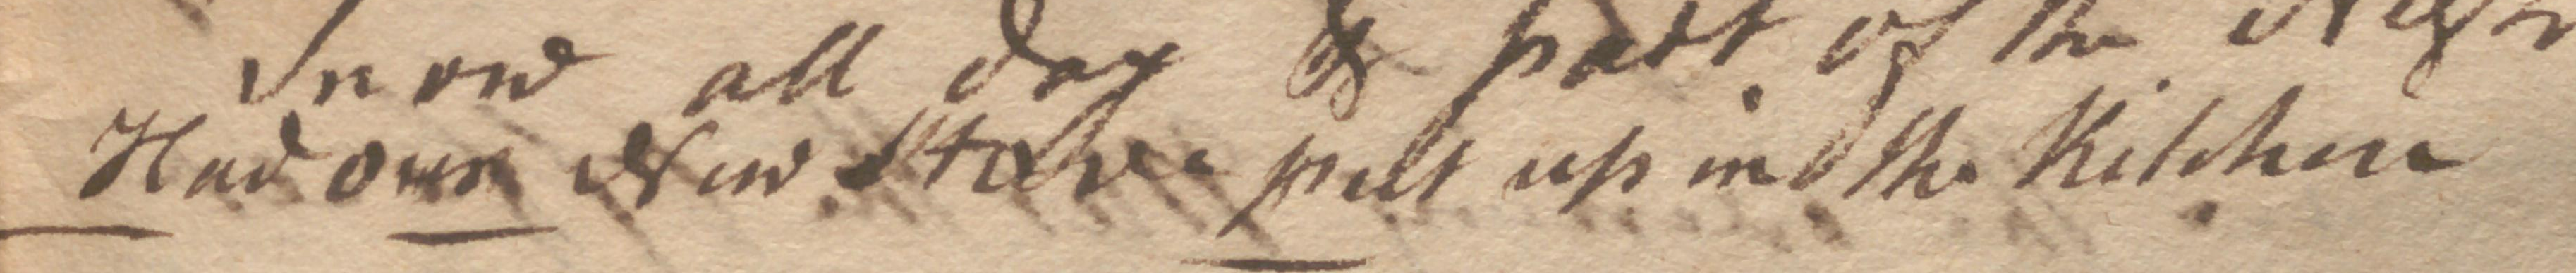Had our New Stove put up in the Kitchen
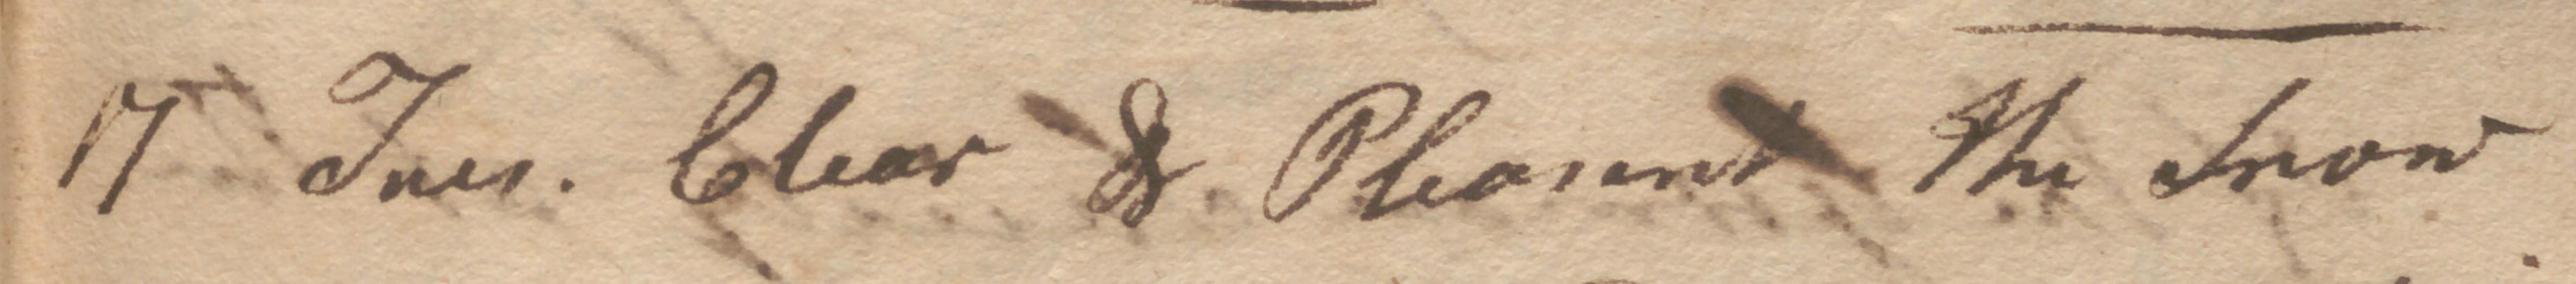17 Tues. Clear &. Pleasent the Snow
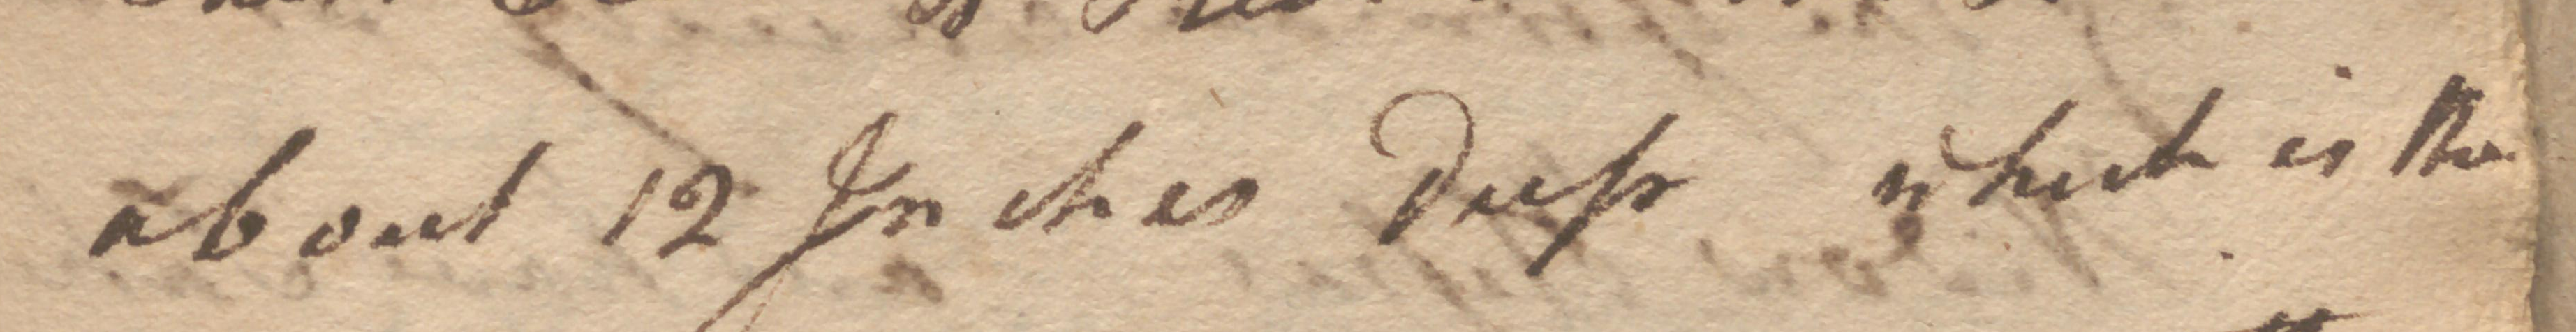about 12 Inches deep which is the
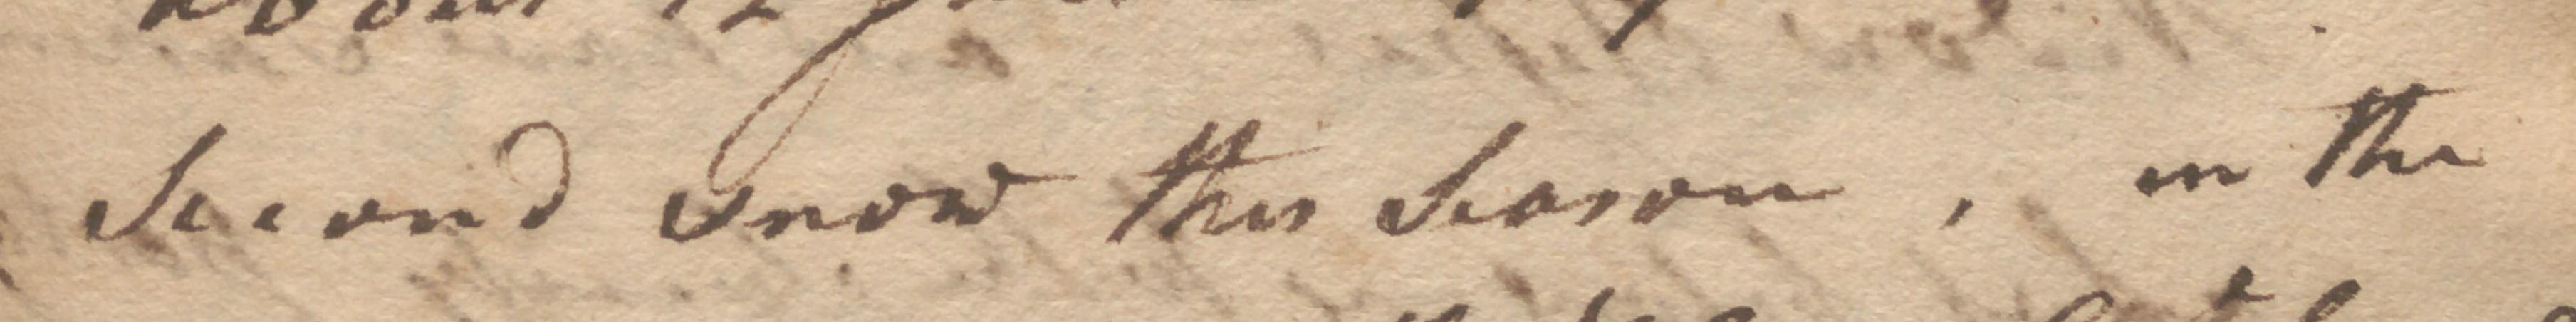second snow this Season, in the
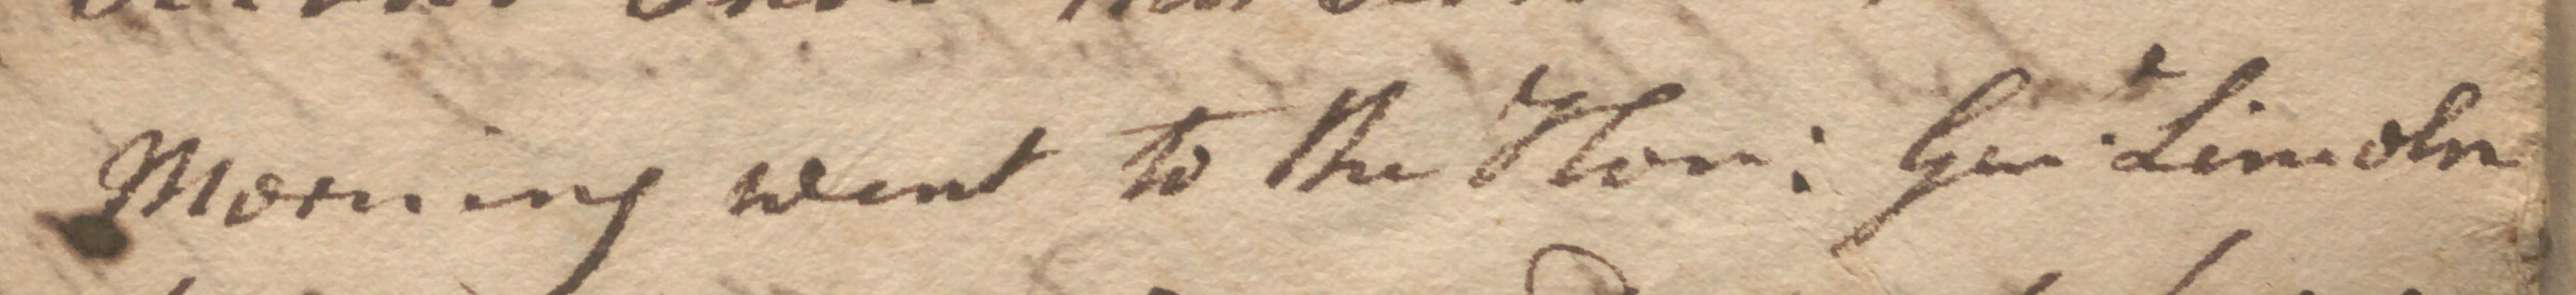morning went to the Hon: Gen^l Lincoln
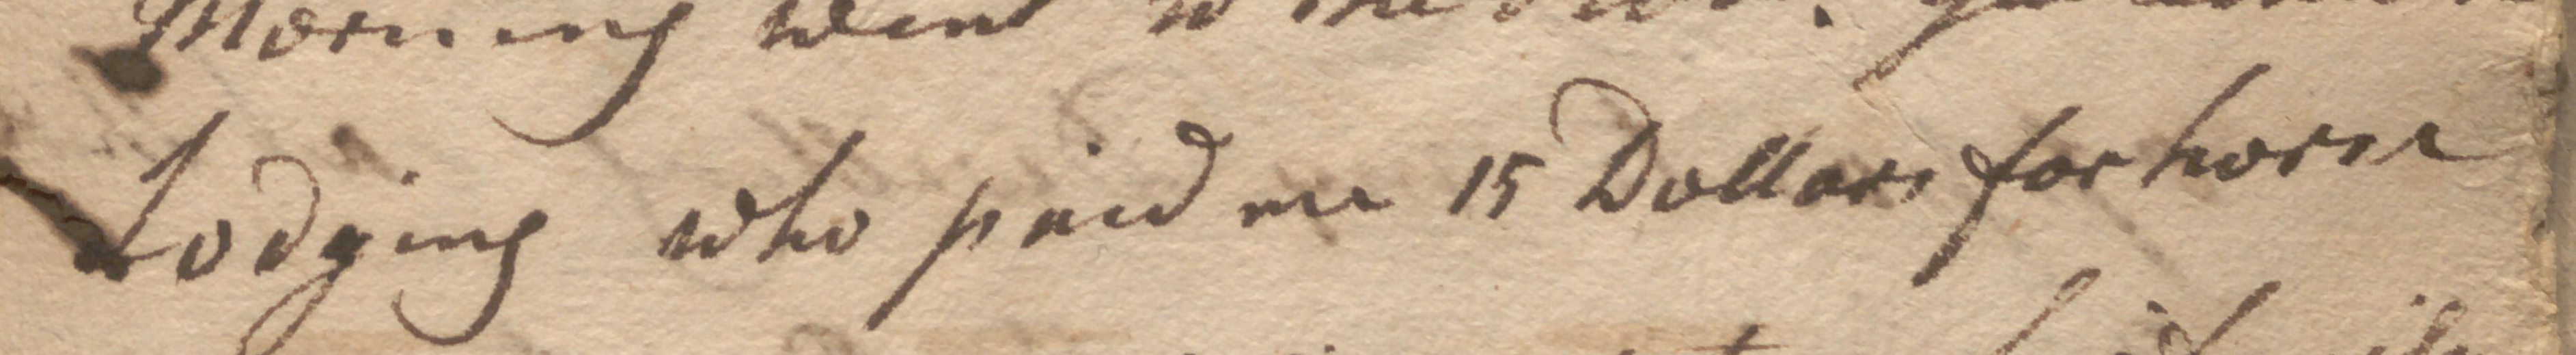Lodging who paid me 15 Dollars for horse
